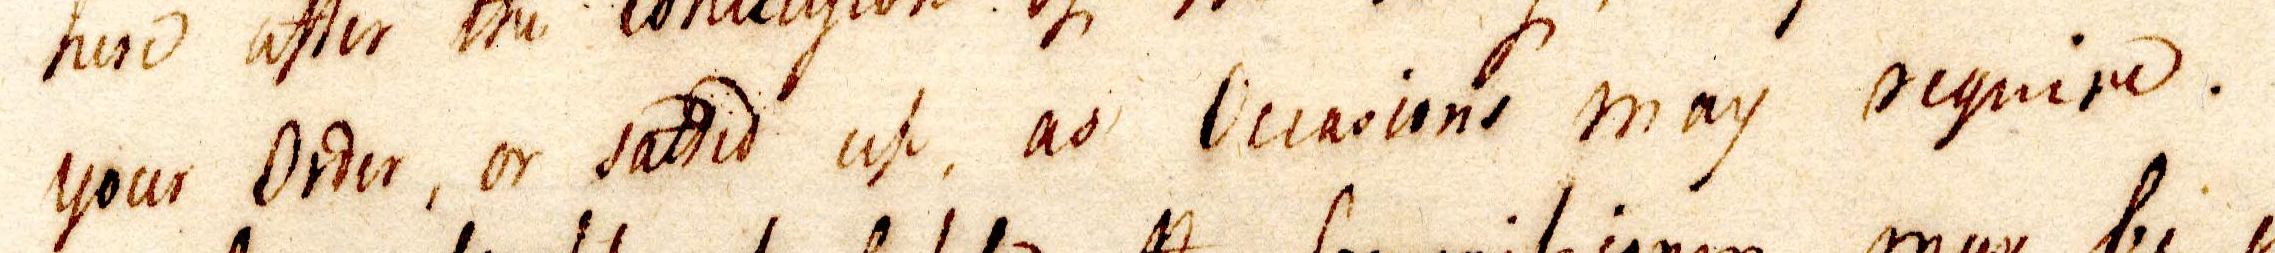your Order, or sattled up, as Occasions may require.
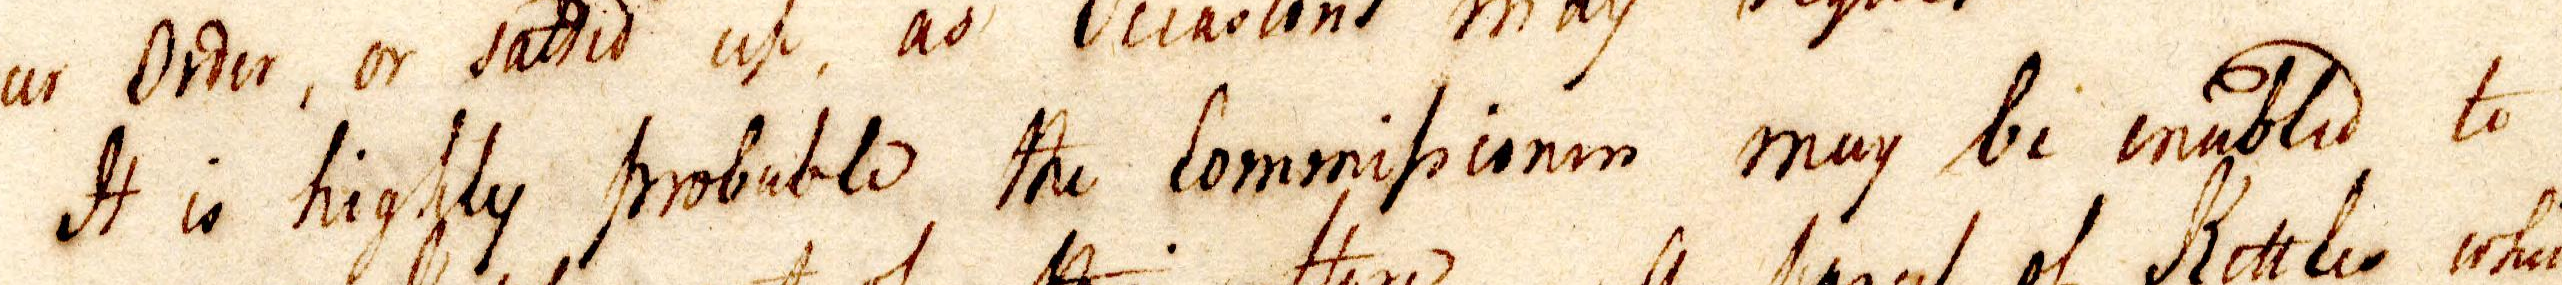It is highly probable the Commissioners may be enabled to
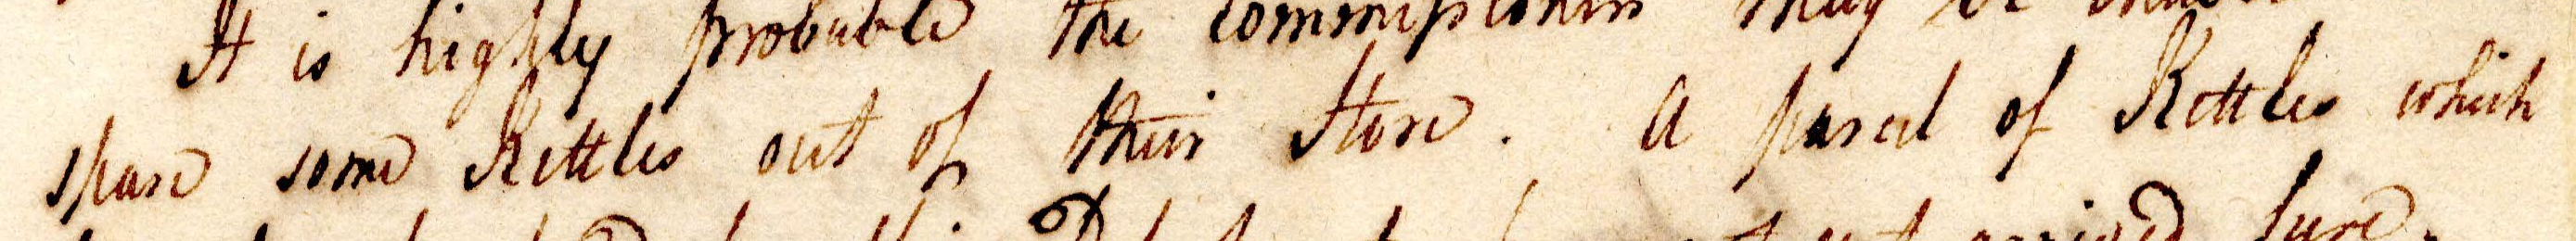spare some Kettles out of their Store. A parcel of Kettles which
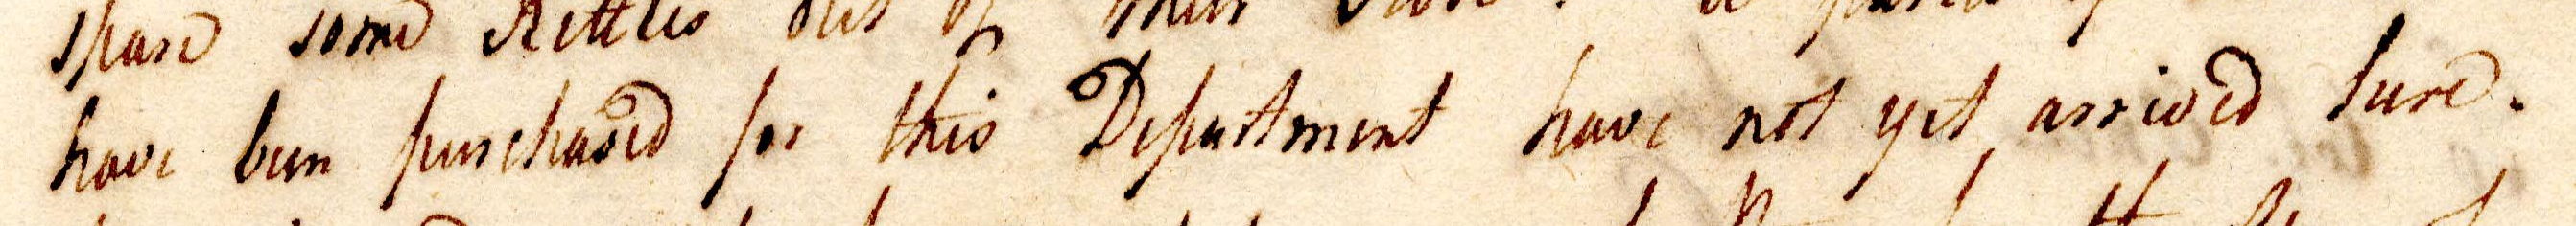have been purchased for this Department have not yet arrived here.
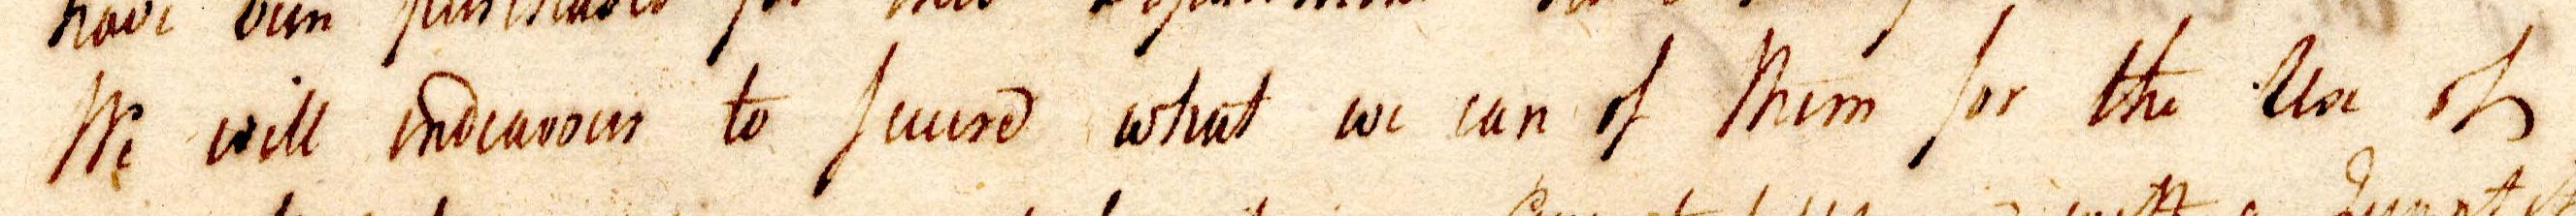We will endeavour to secure what we can of them for the Use of
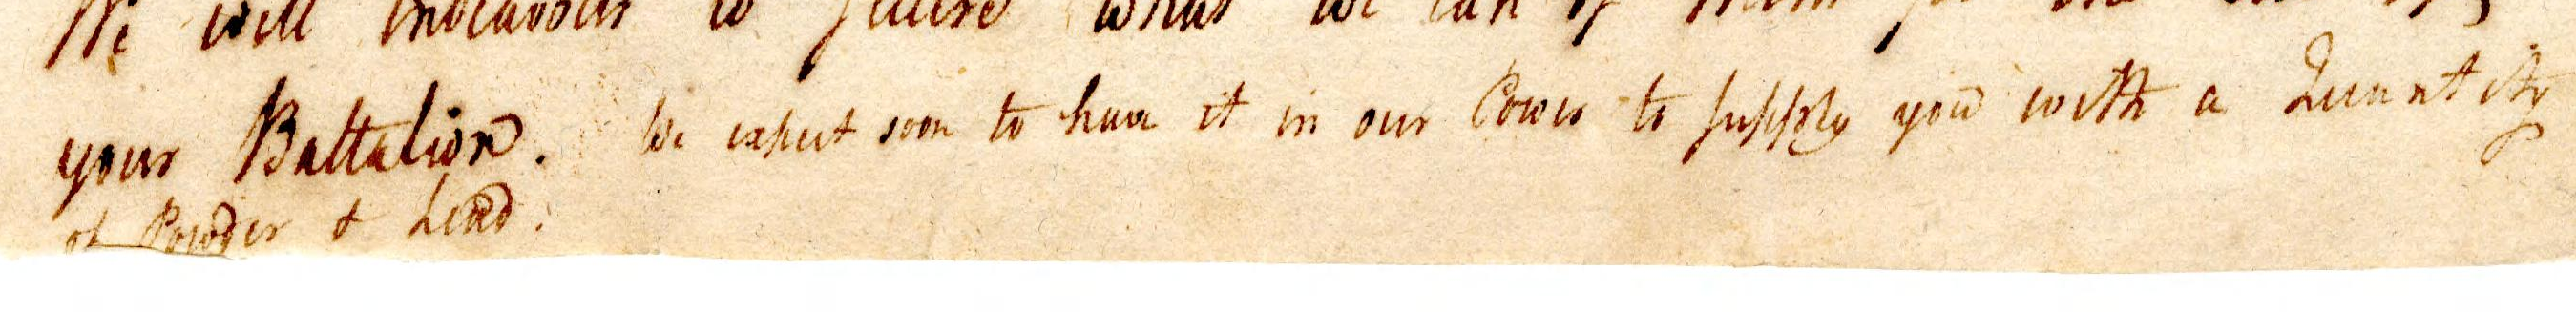your Battalion. We expect soon to have it in our Power to supply you with a Quantity
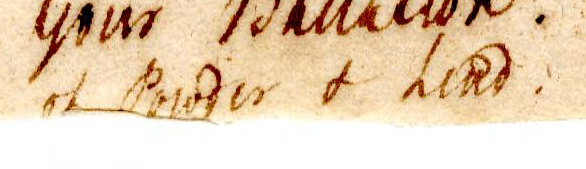of Powder & Lead.
